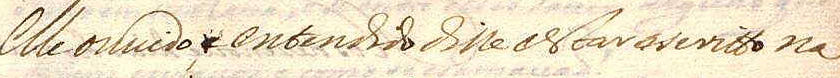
Elle ouuido, e entendido disse estar escritto na
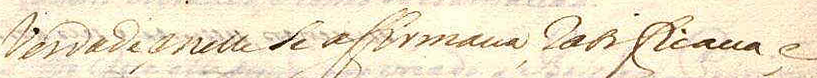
Verdade, e nelle se affirmaua, Ratificaua, e
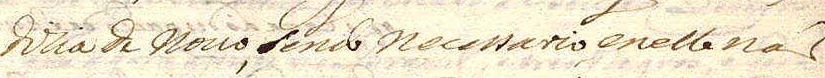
dizia de nouo, sendo necessario, e nelle naõ
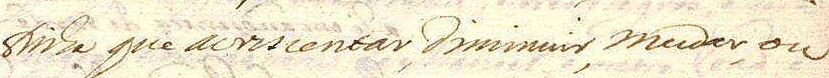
tinha que acrescentar, diminuir, mudar, ou
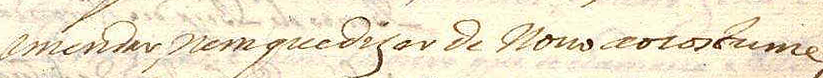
emendar, nem que dizer de nouo ao costume;
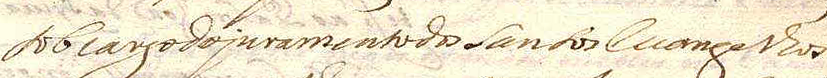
sob cargo do juramento dos santos Euangelhos
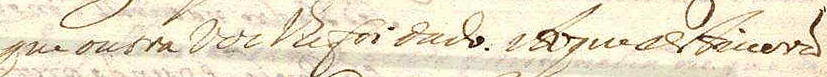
que outra vez lhe foi dado. Ao que estiueraõ
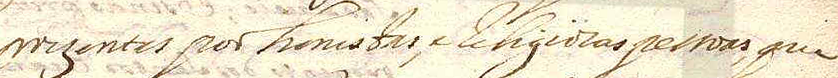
prezentes por honestas, e Religiozas pessoas, que
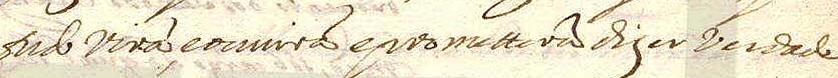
tudo viraõ, e ouuiraõ e prometteraõ dizer verdade
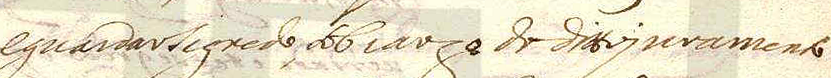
e guardar segredo, sob cargo do ditto juramento
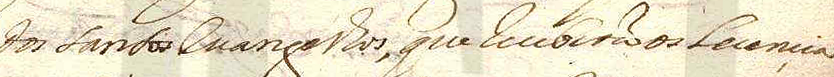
dos Santos Euangelhos, que Receberaõ os Lecençia
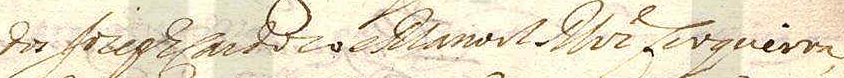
dos Jozeph Cardozo e Manoel Miz̄ Cerqueira,
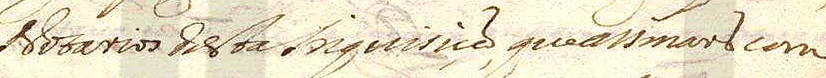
Notarios desta Inquisiçaõ, que assinarã com
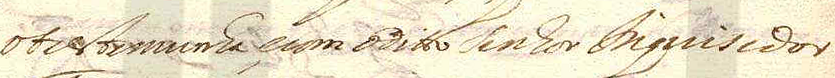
o testemunha, e com o ditto Senhor Jnquisidor
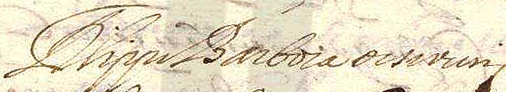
Filippe Barboza o escreui
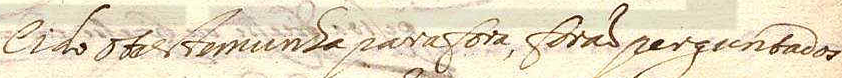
E ido o testemunha para fora, foraõ perguntados
